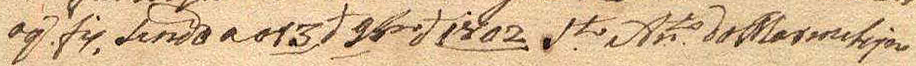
o q̄ fis, sendo aos 13 d̄ 9bro d̄ 1802. S.to An.to de Marmelejo
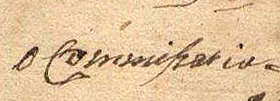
o Commissario
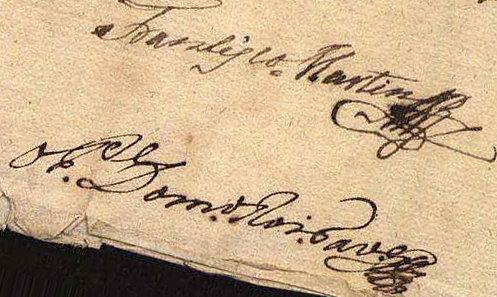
Francisco Martins O R.o Dom.os Rois Tav.es
